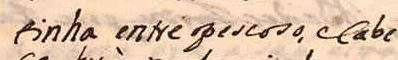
tinha entre pescoso, e cabe
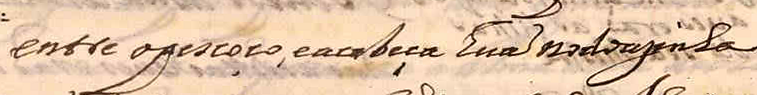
entre o pescoço, e a cabeça huā nodoazinha
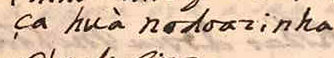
ça huā nodoazinha
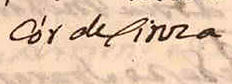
cor de Cinza
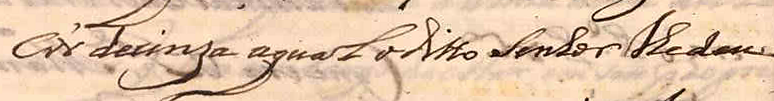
cor de cinza a qual o ditto Senhor lhe deu
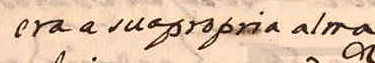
era a sua propria alma
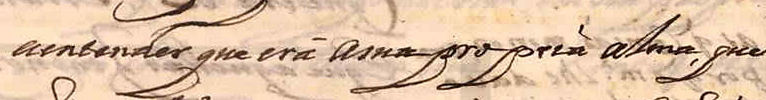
a entender que era a sua propria alma, que
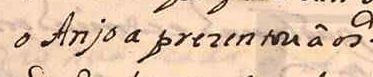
o Anjo aprezentou ao s.or
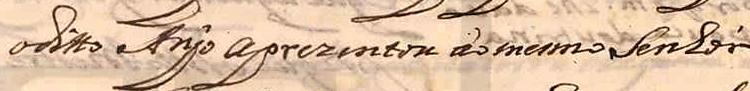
o ditto Anjo aprezentou ao mesmo Senhor
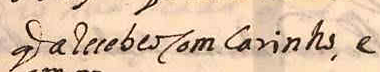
q̄ a Recebeo Com carinho, e
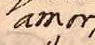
amor,
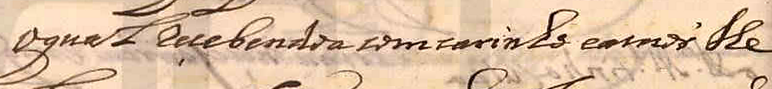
o qual recebendoa com carinho e amor lhe
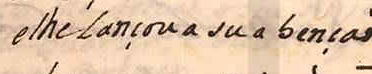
e lhe lançou a sua bençaõ
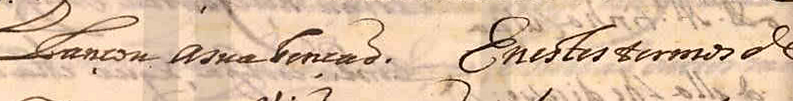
Lançou a sua benção. E nestes termos de
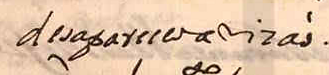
desapareceo a vizaõ.
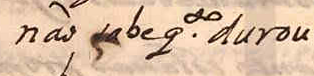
naõ sabe q.to durou
